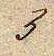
3
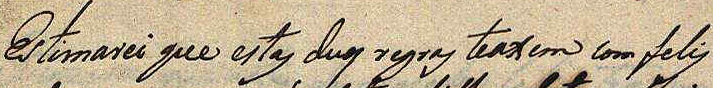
Estimarei que estas duas regras te axem com felis
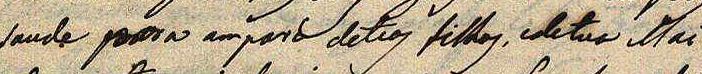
jsaude para amparo de teos filhos, e de tua Mai
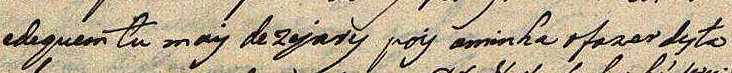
e de quem tu mais dezejares pois a minha o fazer desta
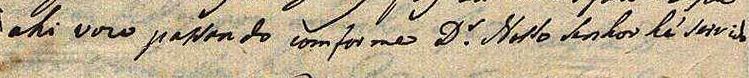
ahi vou passando comforme D.s Nosso Senhor hé servido
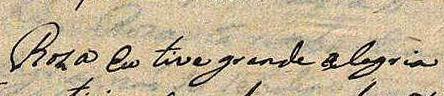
Roza Eu tive grande alegria
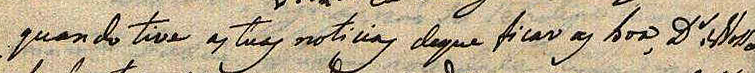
quando tive as tuas noticias de que ficavas boa D.s Nosso
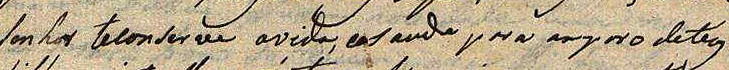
senhor te conserve a vida, e a saude para amparo de teus
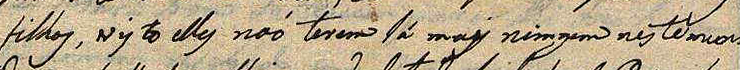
filhos, visto elles naõ terem Já mais nimgem neste mun
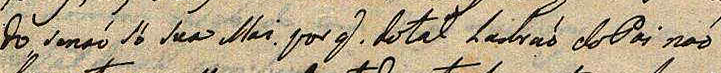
do se naõ só sua Mai. porq̄ do tal Ladraõ do Pai naõ
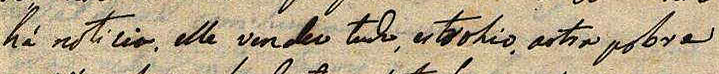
há noticia, elle vendeo tudo estrohio a otra pobre
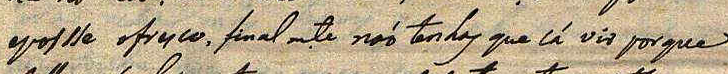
e possse o fresco, finalm.te naõ tenhas que cá vir porque
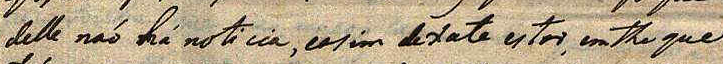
delle naõ há noticia, e asim dexate estar, em lhe que
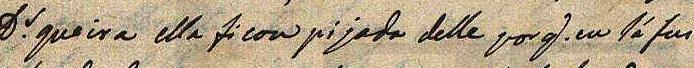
D.s queira ella ficou pijada delle porq̄ eu Já fui
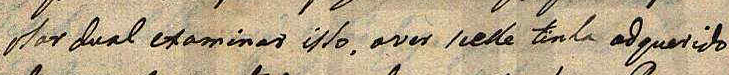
o Sardual examinar isso, a ver se elle tinha adquerido
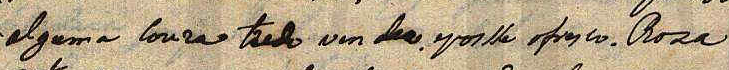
alguma couza tudo vendeo, e possse o fresco. Roza
